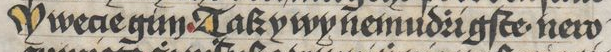Y wecie gim.Tak y vy nemudří gſte.nero¬
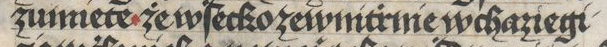zumíete.że wẛecko zewnitṙníe wcháziegí¬
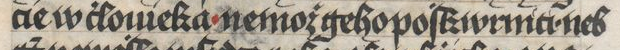cie w ċlouíeka.nemož geho poẛkwrniti.neb
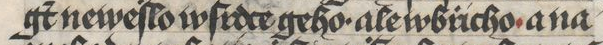ḡt neweẛlo wſrdce geho.ale wbṙicho.a na¬
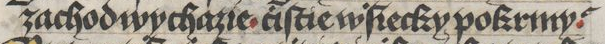zachod wychazíe.ċiſtie wẛiecky pokrmy?
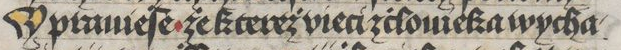Y prauíeẛe.że ktereż wieci zċlouieka wycha¬
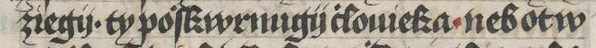zíeij. ty poẛkwrnugij ċlouieka.nebot w¬
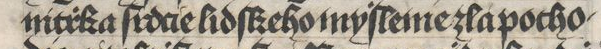nitṙka ſrdcie lidſkeho myẛlenie zla pocho¬
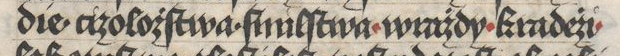die.cizoložſtwa.ſmilſtwa.vrażdy.kradeżi.
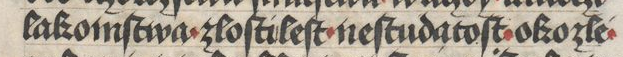lakomſtwa.zloſti leſt.neſtudatoſt.oko zlé
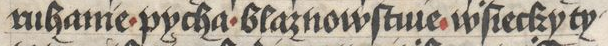ruhaníe.pycha.blaznowſtuíe.wẛiecky ty¬
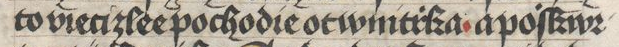to wieci zlee pochodíe ot wnitṙka.a poẛkrw¬
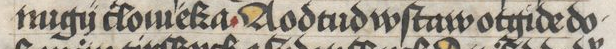nugij ċlouieka.A odtud wſtaw otgide do
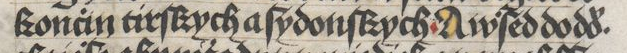konċin tirſkych a ſydonſkych.A wẛed dodov
